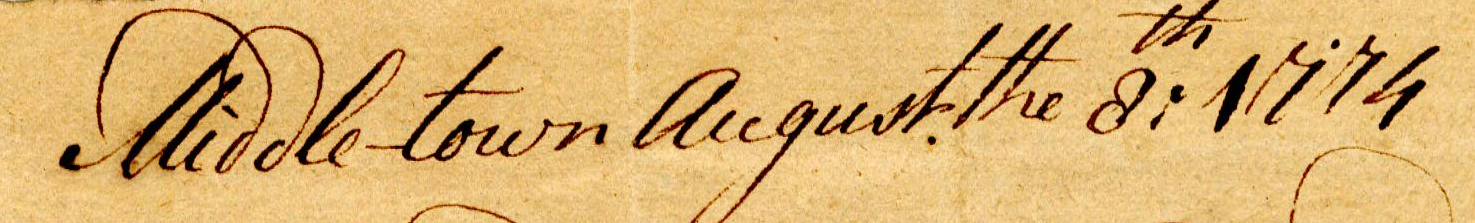Middle-town August. the 8:^th 1774
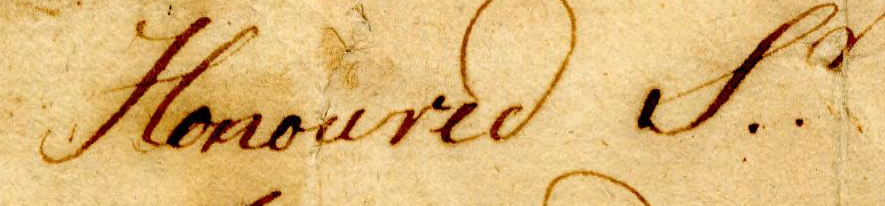Honoured S.^r
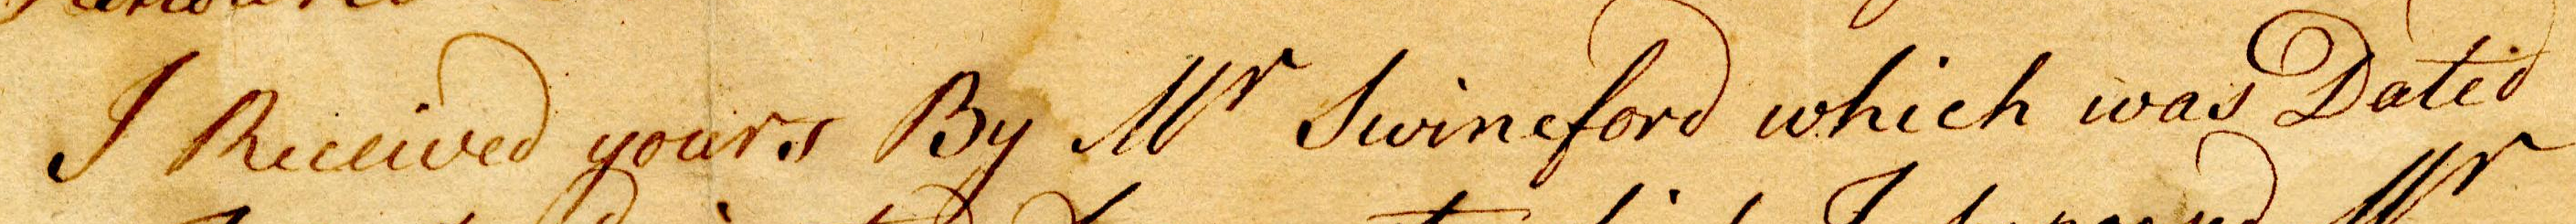I Received yours By M^r Swineford which was Dated
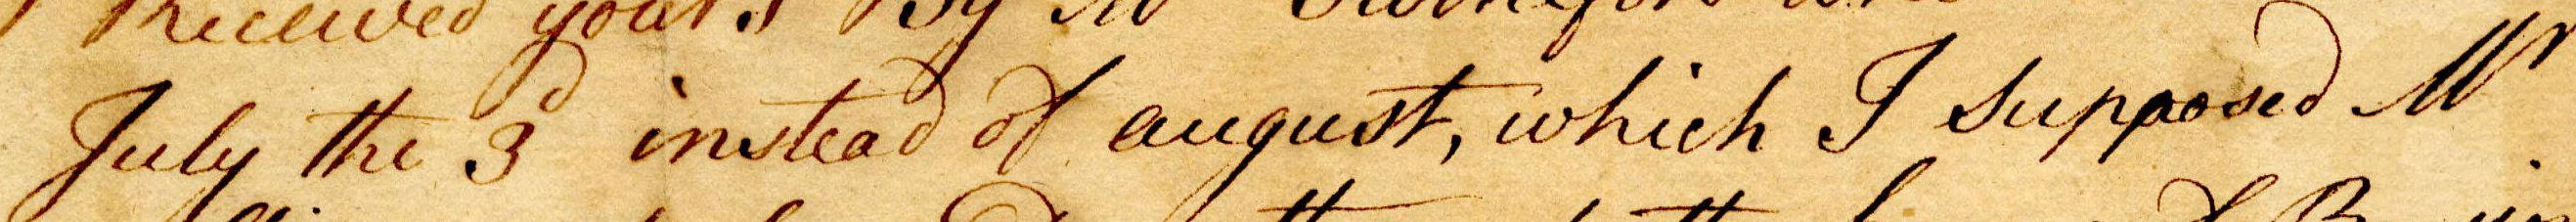July the 3 instead of august, which I supposed M^r
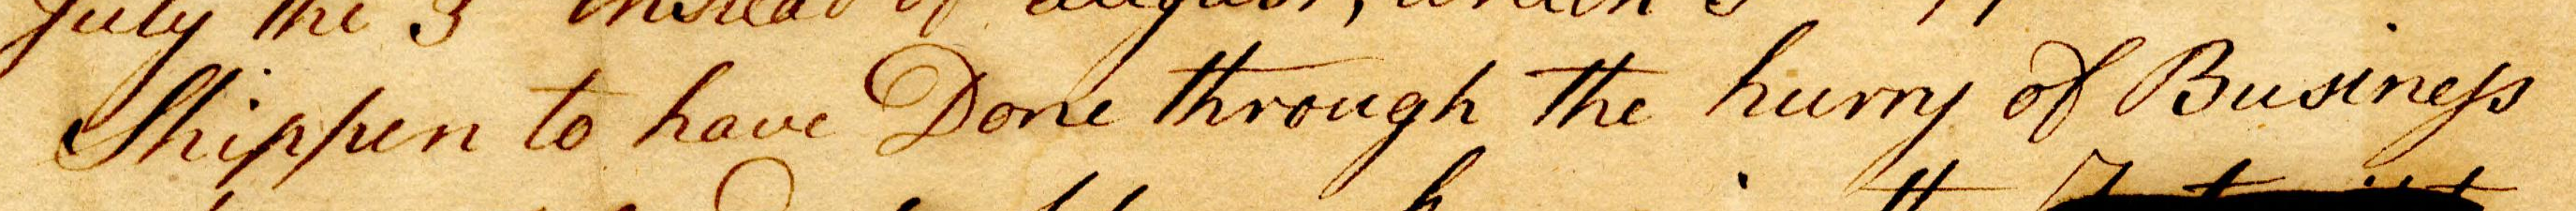Shippen to have Done through the hurry of Business
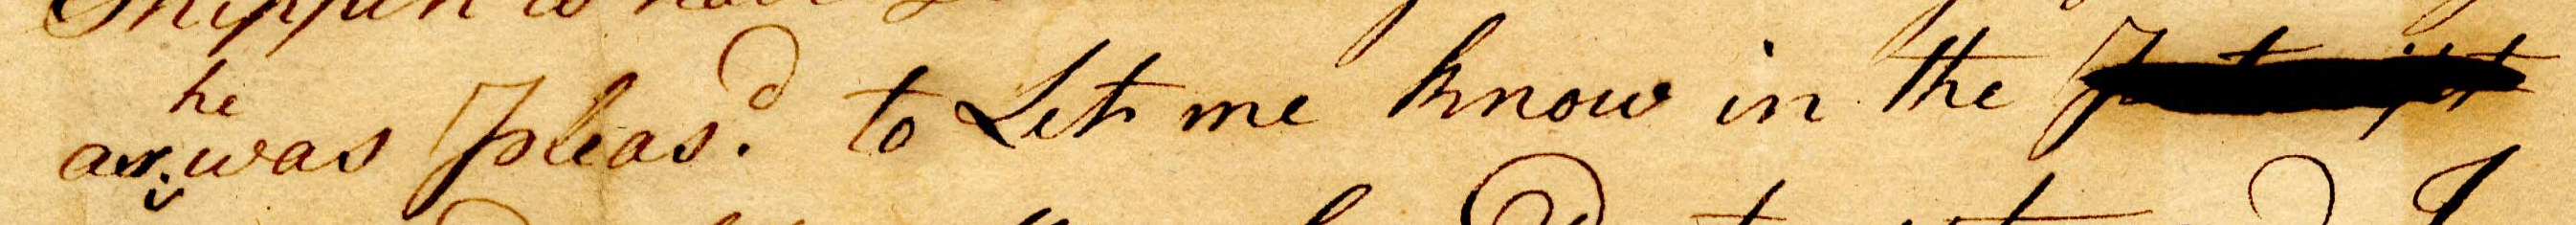as ^he was pleas^d. to Let me know in the [______]
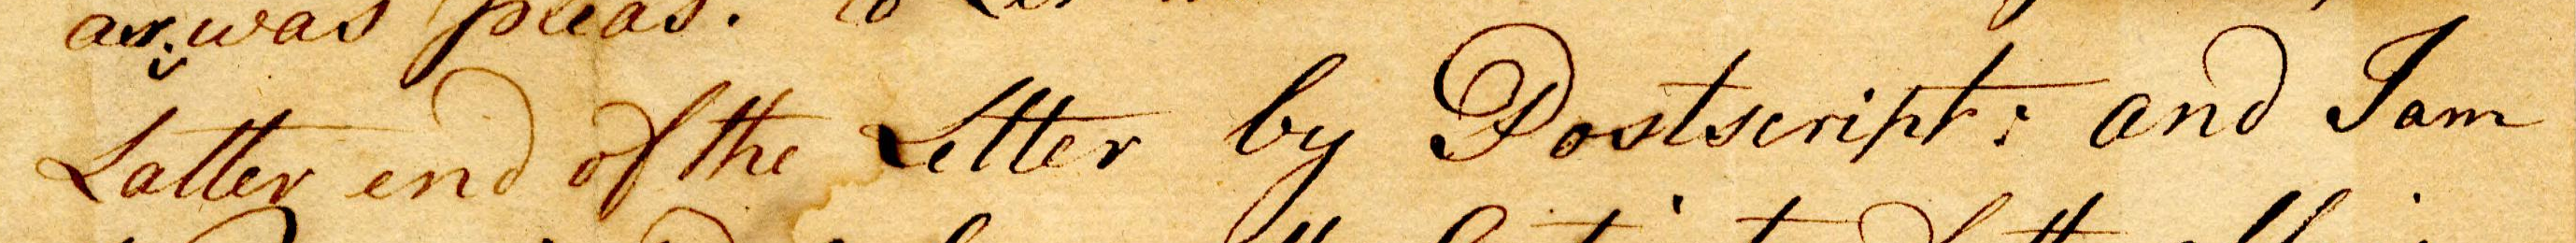Latter end of the Letter by Postscript: and I am
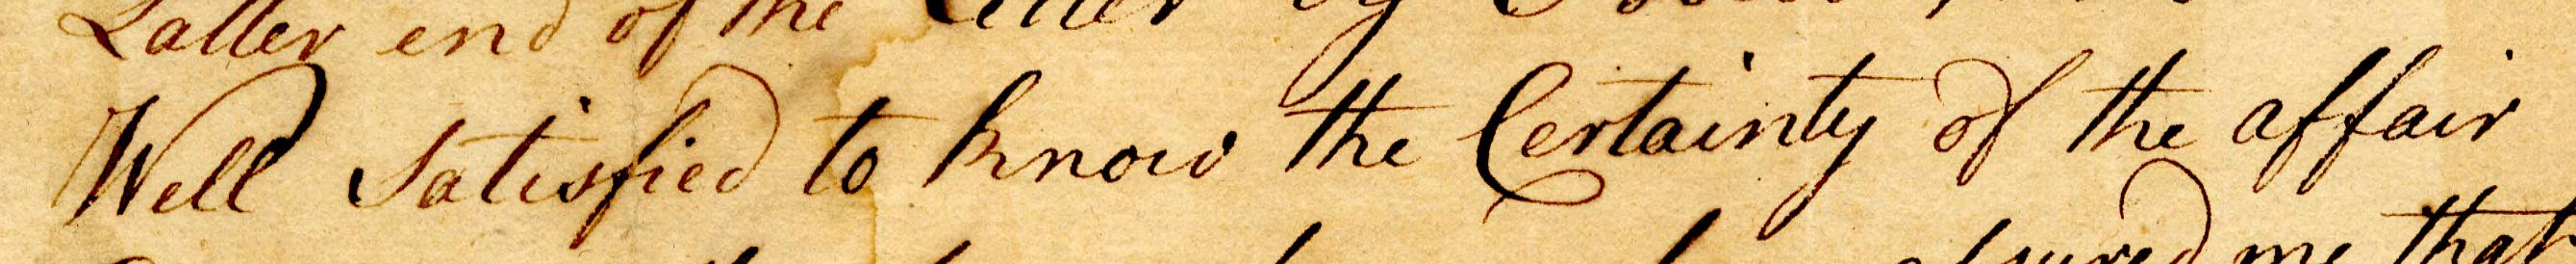Well Satisfied to know the Certainty of the affair
